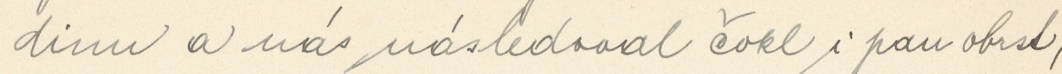dinu a nás následoval čokl i pan obrst,
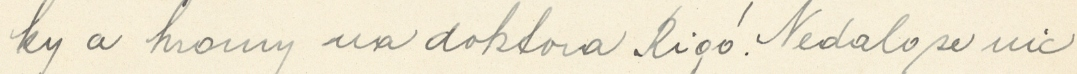ky a hromy na doktora Rigó. Nedalo se nic
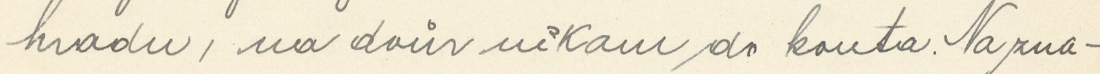hradu, na dvůr někam do kouta. Na zna-
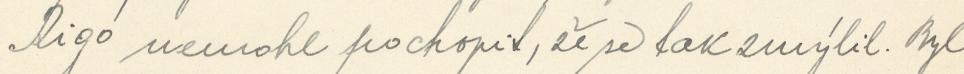Rigó nemohl pochopit, že se tak zmýlil. Byl
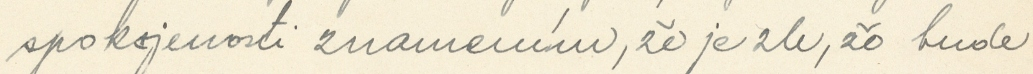spokojenosti znamením, že je zle, že bude
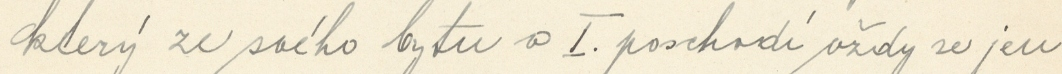který ze svého bytu v I. poschodí vždy se jen
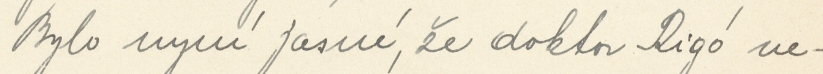Bylo nyní jasné, že doktor Rigó ne-
